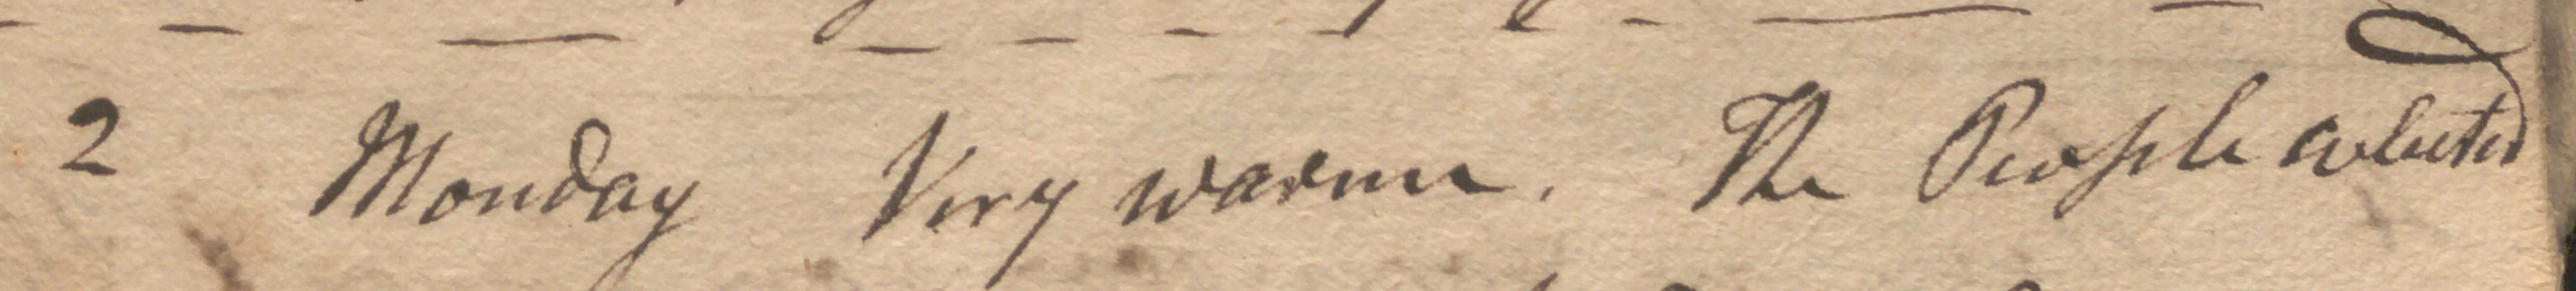2 Monday Very warme. The People colected
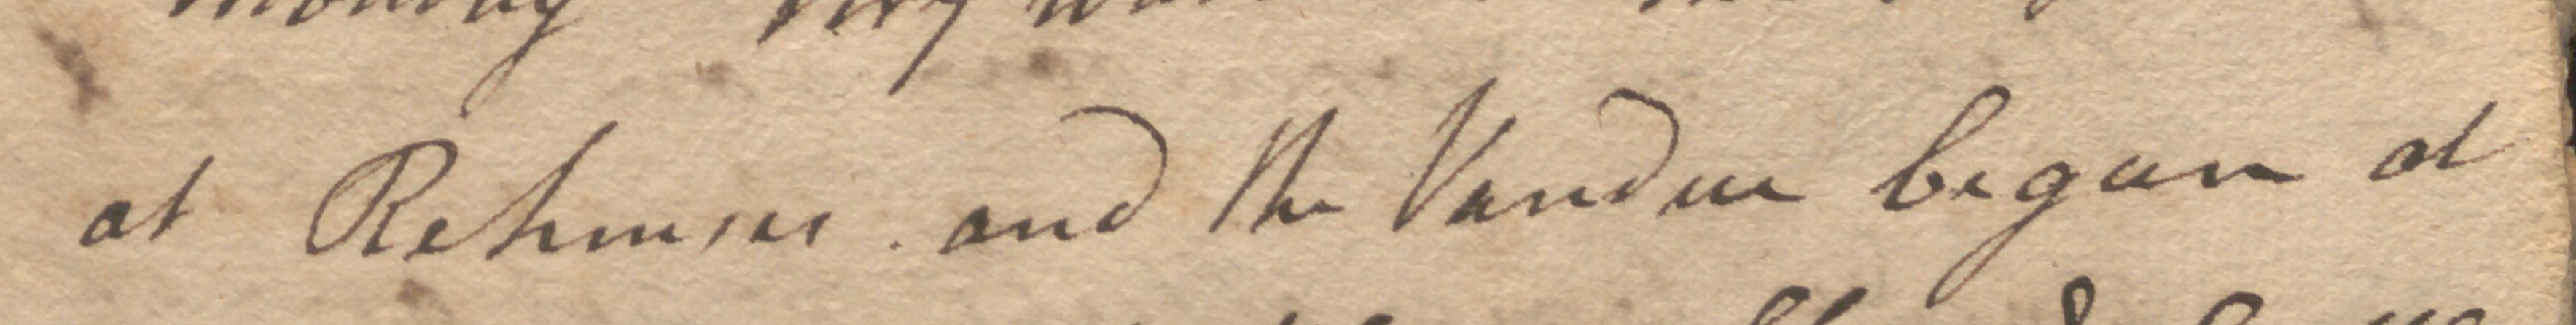at Rehmses, and the Vandue began at
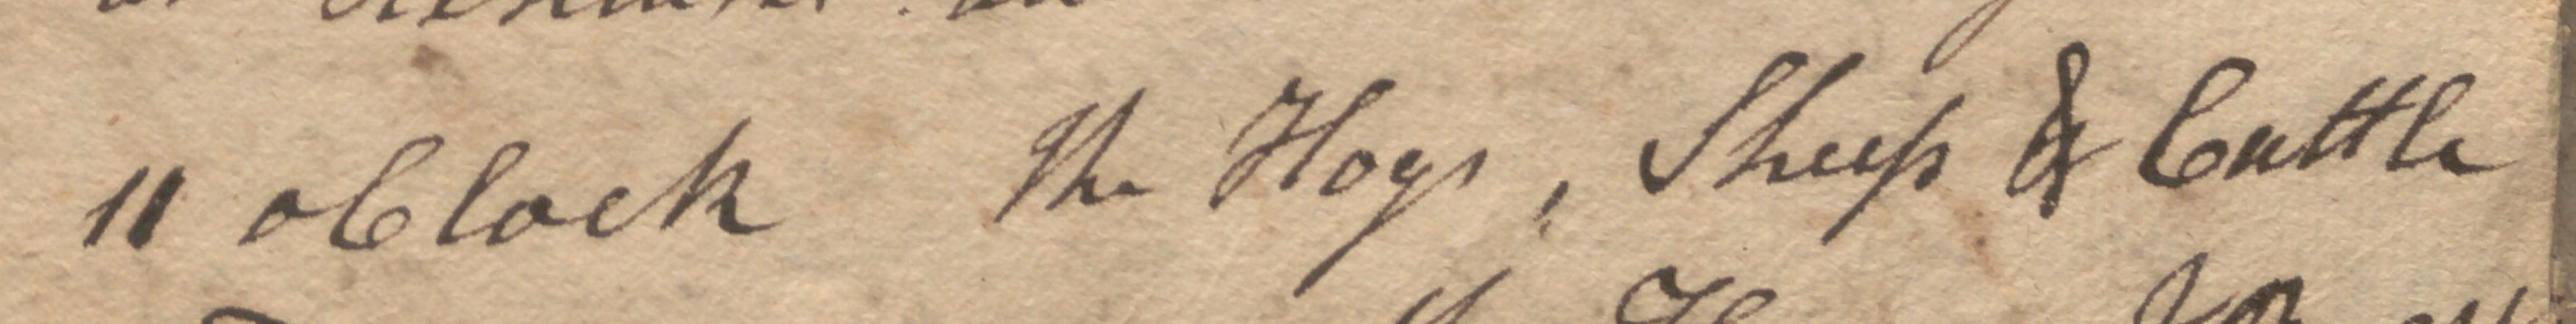11 oClock the Hogs, Sheep & Cattle
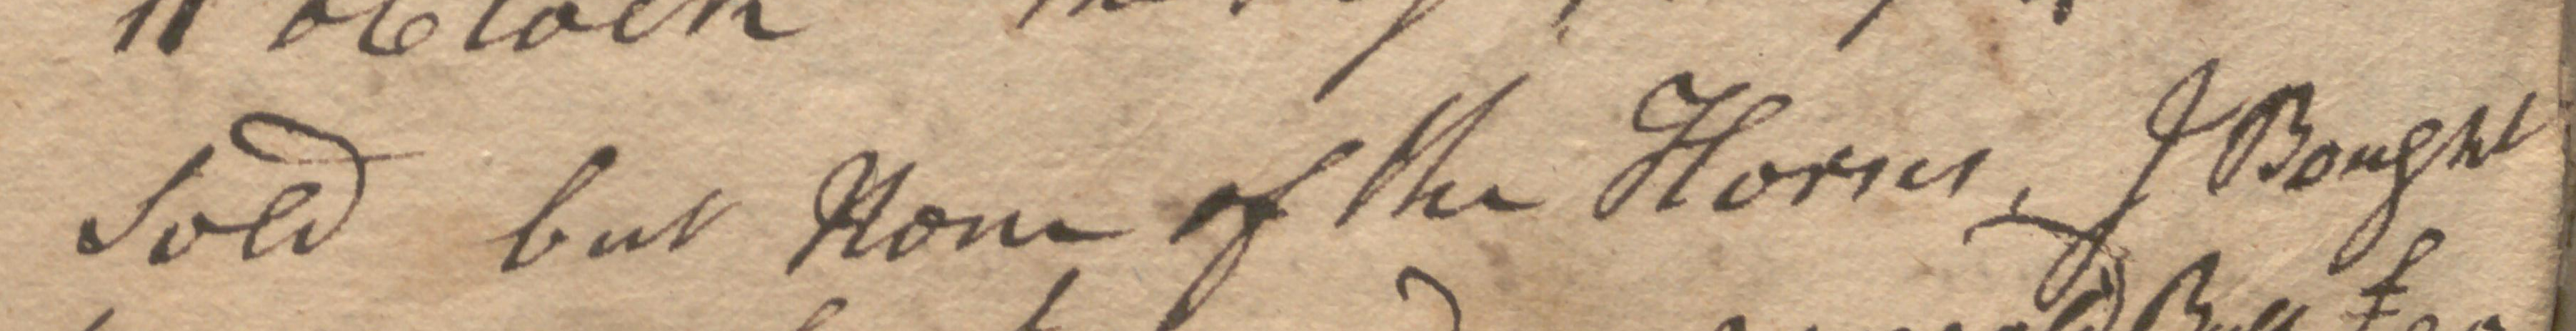sold but None of the Horses, I Bought
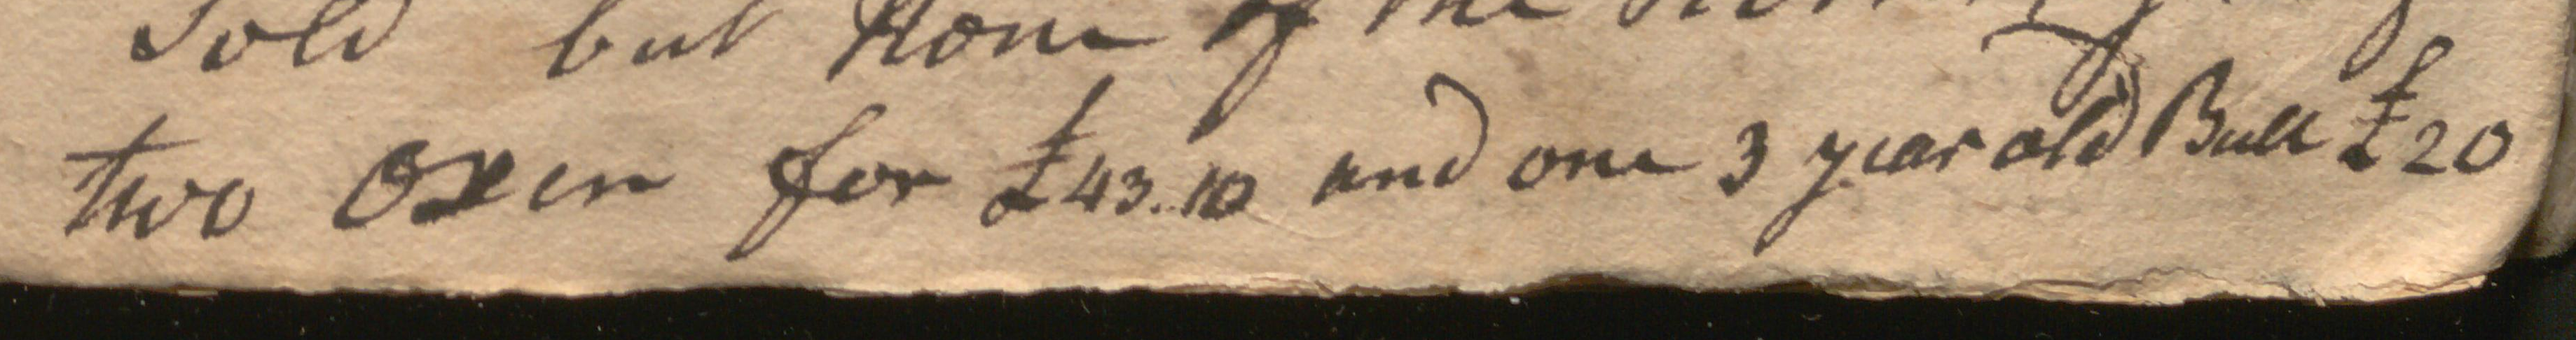two oxen for £43.10 and one 3 year old Bull £20
